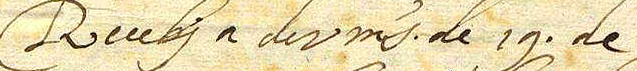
Recebj a dez ms̄. de 19. de
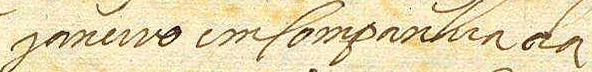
janeiro em Companhia da
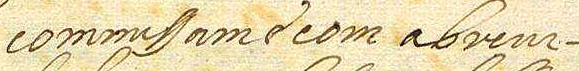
commissam & com a breui
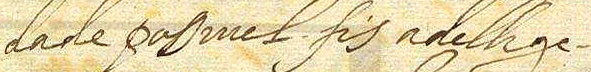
dade possiuel fis a dellige
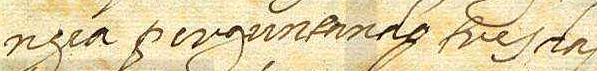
nsea pergutando tres das
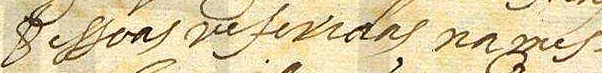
Pessoas referidas na mes
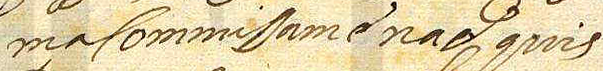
ma Commissam & naõ quis
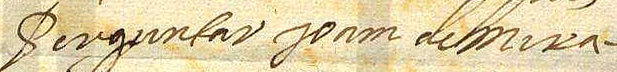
Perguntar joam de mira
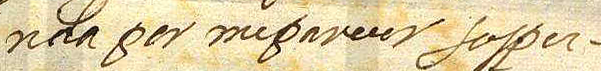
nda por me parecer sospei
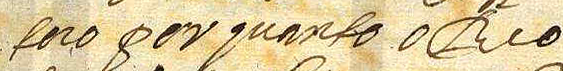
tozo porquanto o Reo
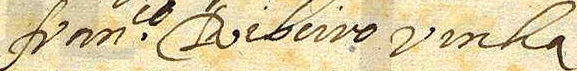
fran.co Ribeiro vinha
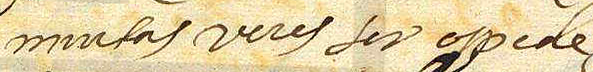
muitas vezes ser ospede
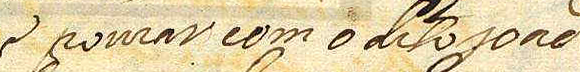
& pouzar com o dito joaõ
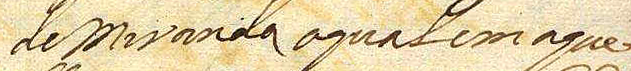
de miranda o qual em aque
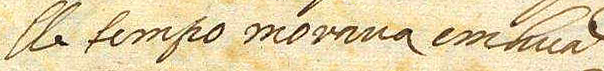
lle tempo moraua em huā
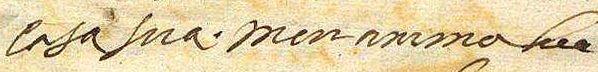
casa sua. meu animo hee
